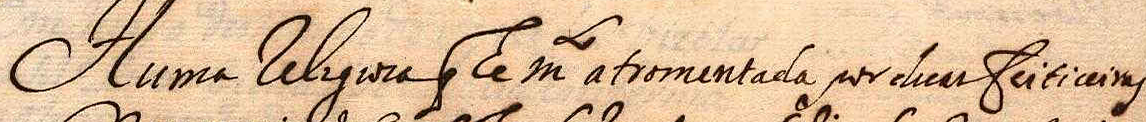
Huma Religioza q̄ he mto atromentada por duas feiticeiras
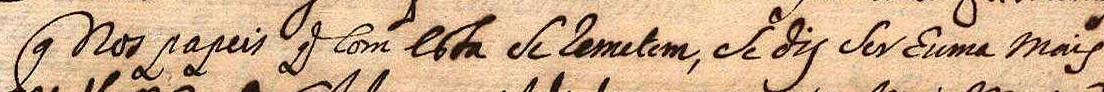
q̄ nos papeis q̄ com esta se Remetem, se dis ser huma mais
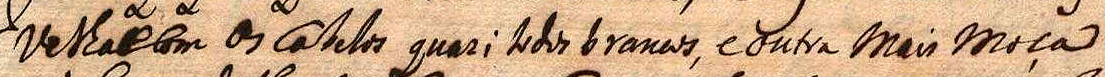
velha e com os Cabelos quazi todos brancos, e outra mais moça
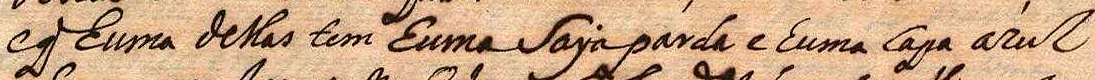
e q̄ huma dellas tem huma saya parda e huma capa azul
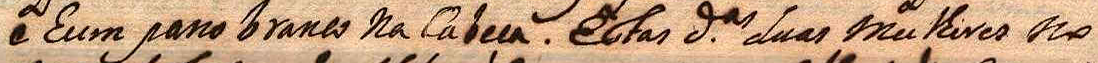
e hum pano branco na cabeça. Estas d.as duas mulheres no
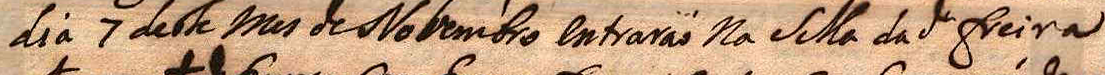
dia 7 deste mes de Novembro entraraõ na sella da da freira
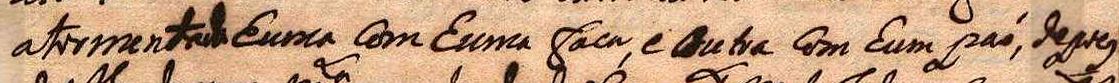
atormentada huma com huma faca, e outra com hum paó, depoes
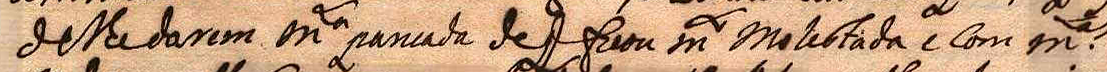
de lhe darem mta pancada de q̄ ficou mto molestada e com m.tas
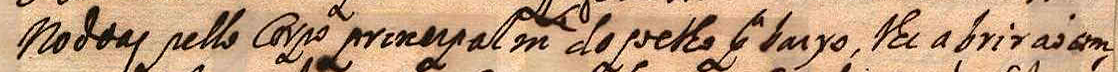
nodoas pello Corpo principalmte do joelho pa baixo, lhe abriraõ com
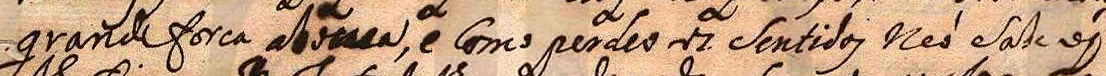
grande força a bocaca, e Como perdeo os sentidos naõ sabe o q̄
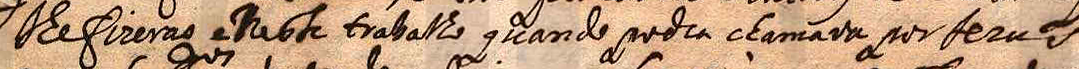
lhe fizerao e neste trabalho quando podia chamava por Iezus
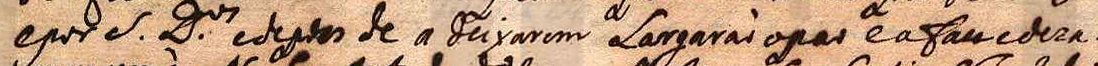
e por S. D.os e depoes de a deixarem Largaraõ o pao e a faca e deza
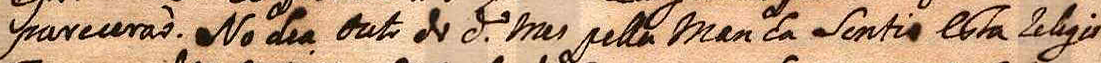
pareceraõ. No dia outo do d.o mes pella manha sentio esta Religio
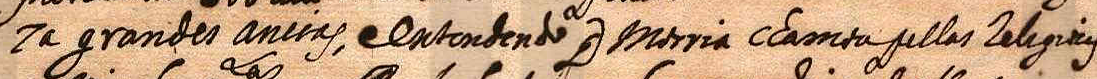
za grandes ancias, e entendendo q̄ morria chamou pellas Religiozas
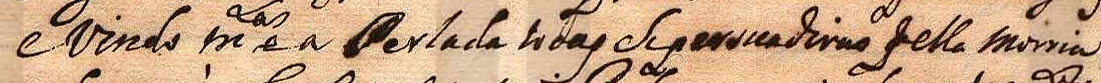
e vindo mtas e a Perlada todas se persuadirao q̄ ella morria
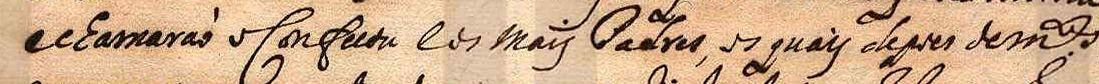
e chamaraõ o Confecou e os mais Padres, os quais depoes de mtos.
